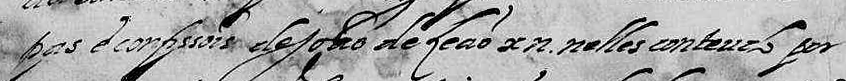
pas e confissoĩs de João de Leaõ xn. nelles conteudo por
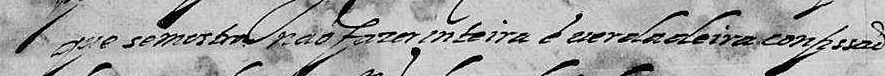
que se mostra naõ fazer inteira e uerdadeira confissaõ
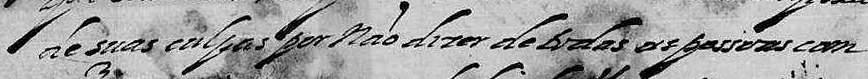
de suas culpas por naõ dizer de todas as pessoas com
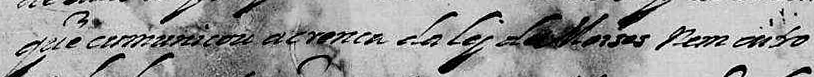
quē comunicou a crença da lej de Moises nem outro
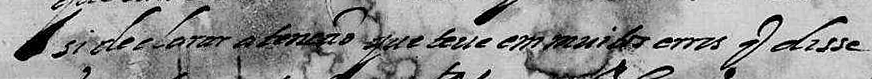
si declarar a tençaõ que teue em muitos erros q̄ disse
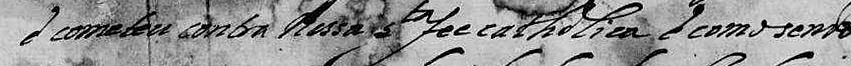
e cometeu contra nossa sta fee catholica e como sendo
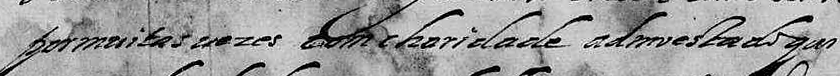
por muitas uezes com charidade admoestado qui
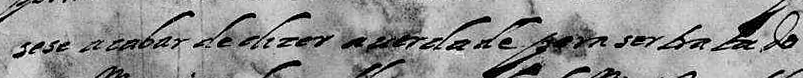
sese acabar de dizer a uerdade para ser tratado
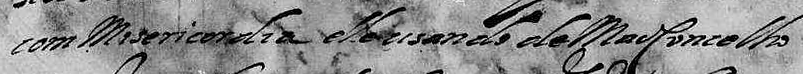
com Misericordia ele usando de Mao Concelho
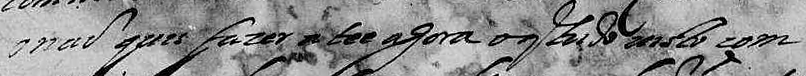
o naõ quer fazer atee agora o q̄ tudo uisto com
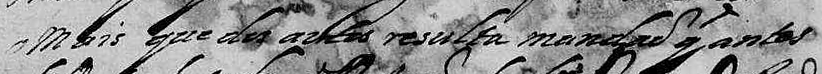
o mais que dos autos resulta mandaõ q̄ antes
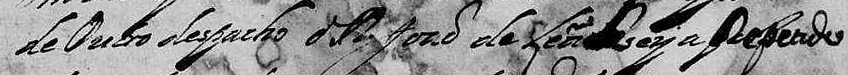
de Outro despacho o R. Joaõ de Leã_ seija presentado
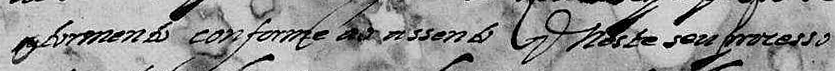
a tormento conforme ao assento q̄ neste seu processo
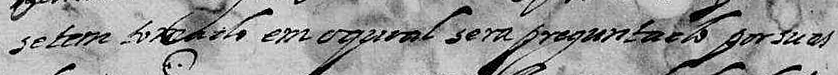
se tem tomado em o qual sera preguntado por suas
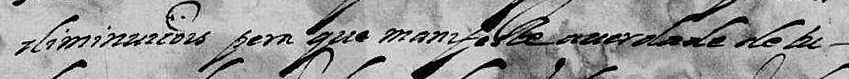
diminuiçõis pera que manifeste a uerdade de tu
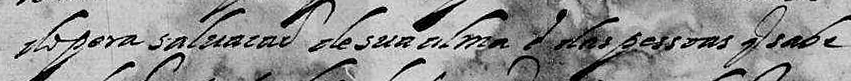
do pera saluaçaõ de sua alma e das pessoas q̄ sabe
